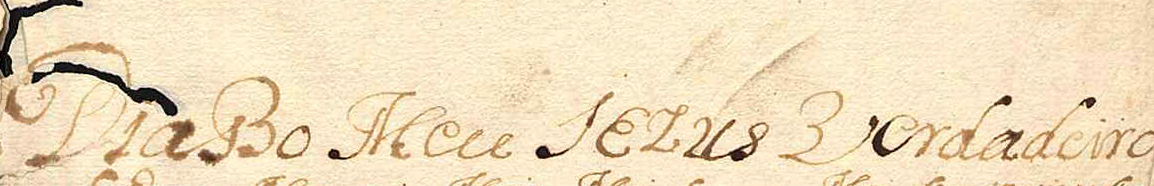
DiaBo Meu IEZUS Verdadeiro
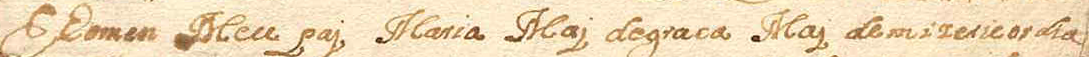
E homen Meu paj Maria Maj de graça Maj de mizericordia
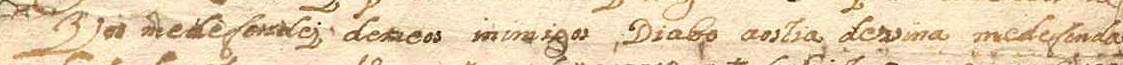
Vos me defendej de meos inimigos, Diabo a ostia devina me defenda
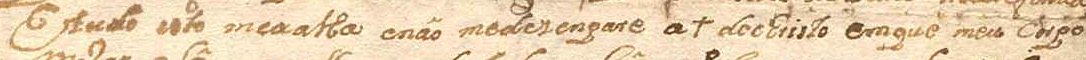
E tudo isto mevalha e naõ me dezenpare a + de christo em que meu corpo
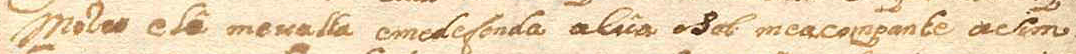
moReo ela me ualha e me defenda a lua o sol me acompanhe asim
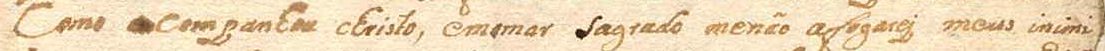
Como acompanhou christo, em o mar sagrado me não afogarej meus inimi
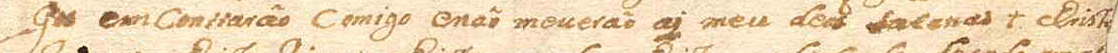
gos emcontraraõ comigo e naõ me ueraõ aj meu deus satanas + christo
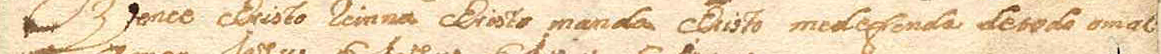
Vence christo Reinna christo manda chisto me defenda de todo o mal
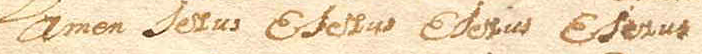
Amen Iezus E Iezus E Iezus E Iezus
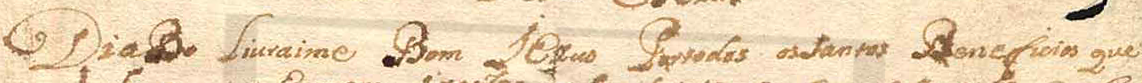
DiaBo Liuraime Bom IEzus Por todos os santos Beneficios que
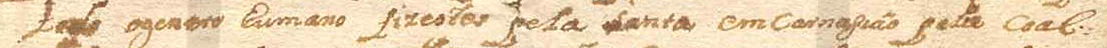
todo o genero humano fizestes pela santa emcarnassaõ pela coal
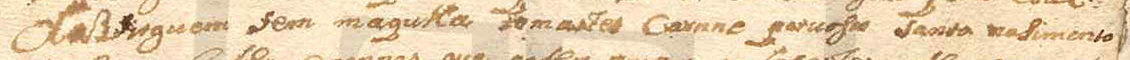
da Virguem sem maqulla tomastes Carnne por uoso santo nasimento
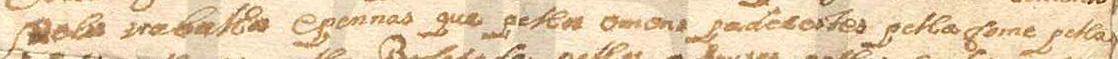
Pelo trabalho e pennas que pellos omens padecestes pella fome pella
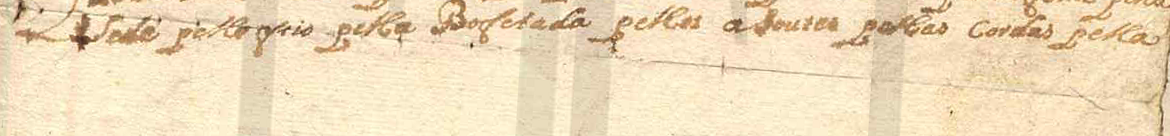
Sede pello frio pella Bofetada pellos asoutes pellas cordas pella
